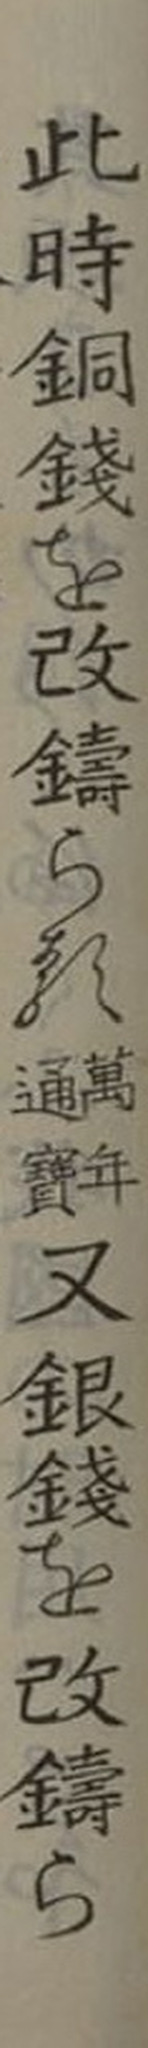此時銅錢改鑄らる萬年通寶又銀錢を改鑄ら
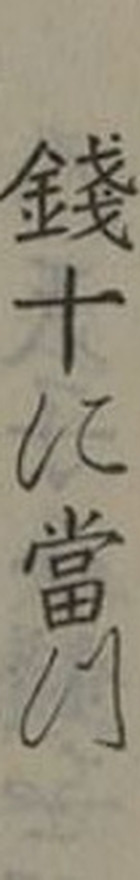錢十に當つ

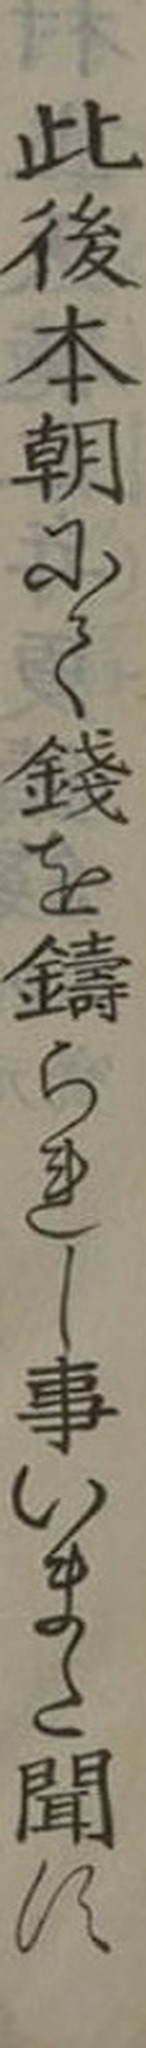此後本朝にて錢を鑄られし事いまた聞す
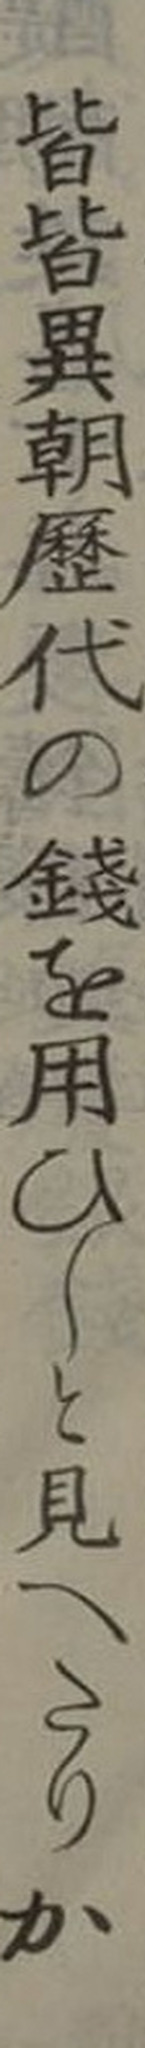皆皆異朝歴代の銭を用ひしと見へたりか
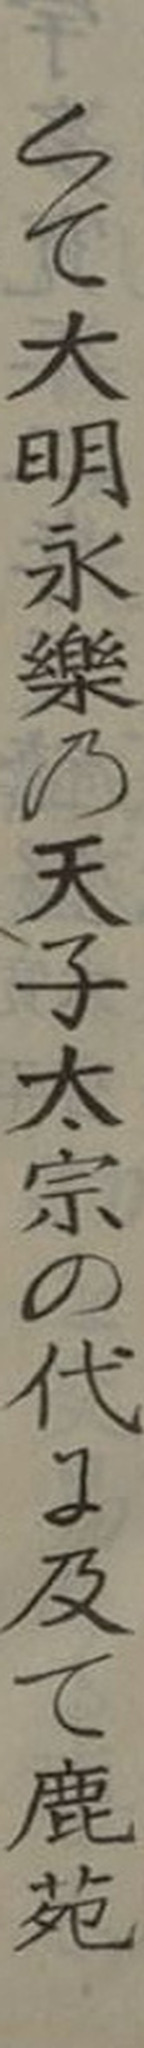くて大明永樂の天子太宗の代に及て鹿苑
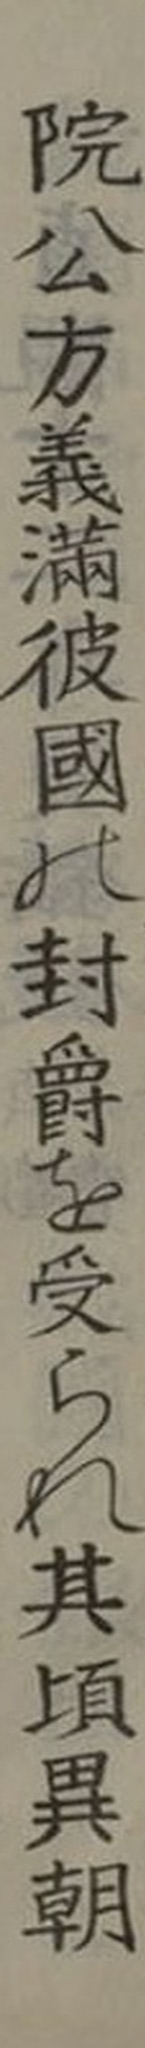院公方義滿彼國の封爵を受られ其頃異朝
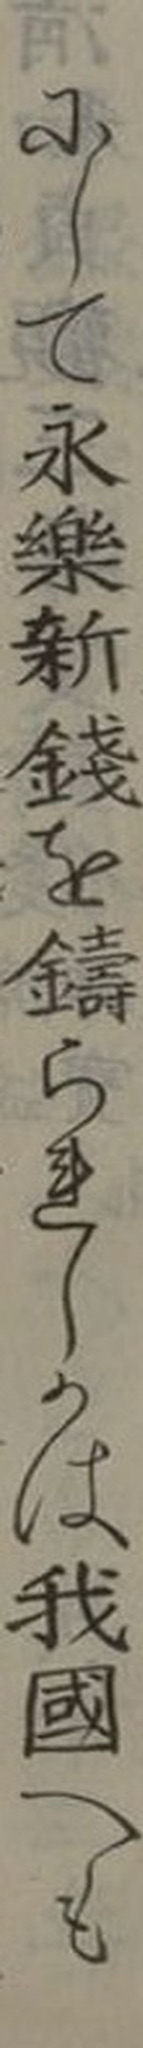にして永樂新錢を鑄られしかは我國へも
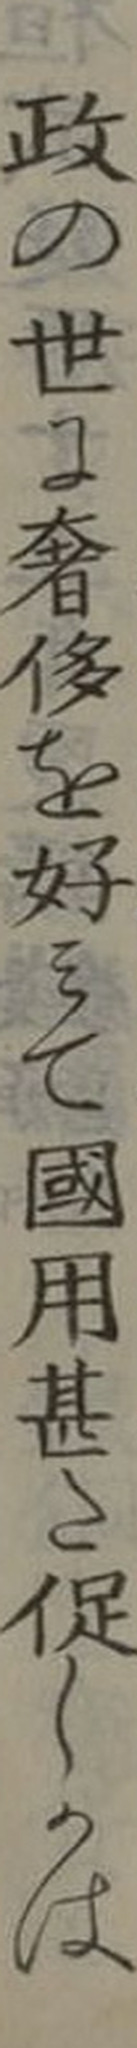政の世に奢侈を好みて國用甚た促しかは
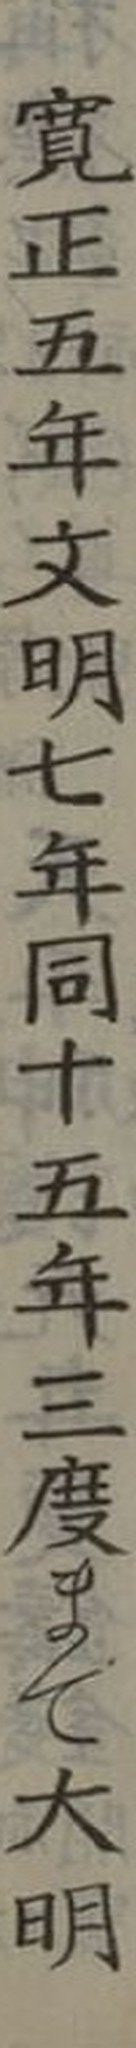寛正五年文明七年同十五年三度まて大明
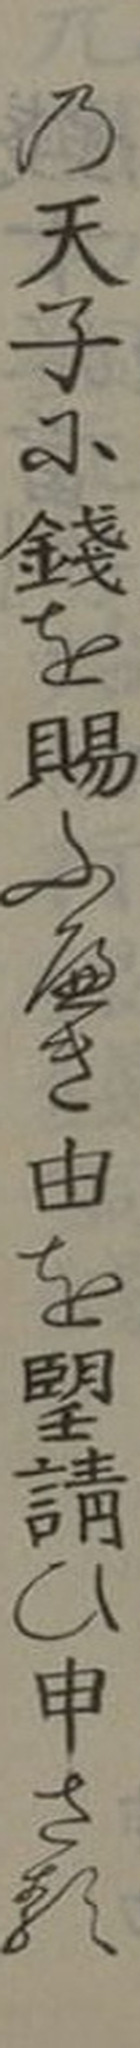の天子に錢を賜ふへき由を朢請ひ申さる
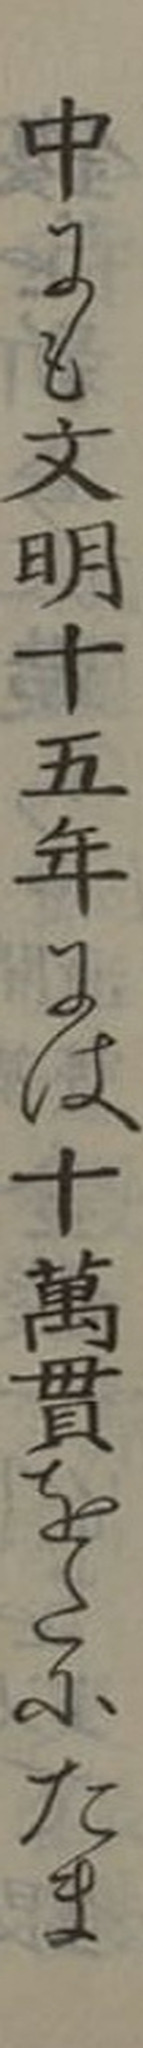中にも文明十五年には十萬貫をたにたま
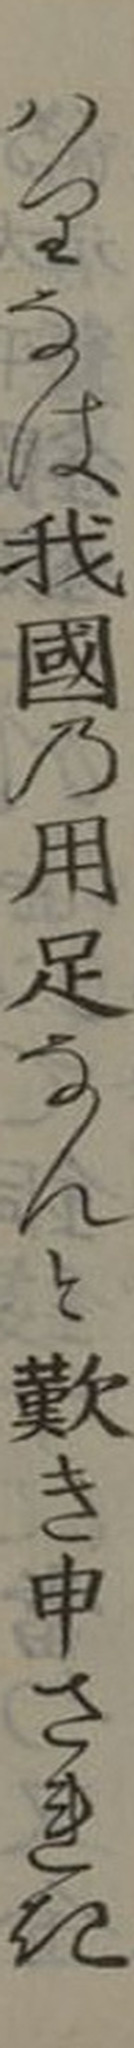はりなは我國の用足なんと歎き申されき
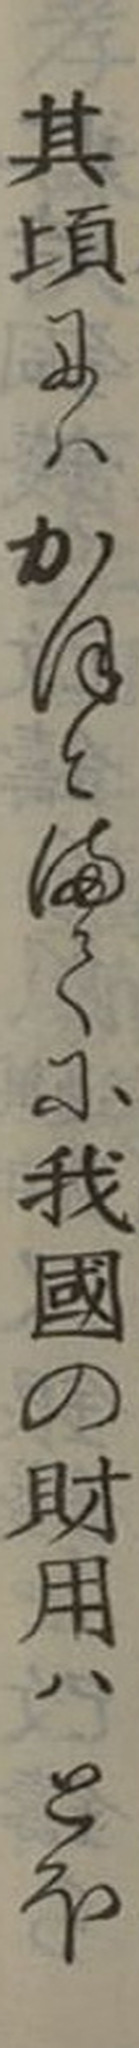其頃にはかほとまてに我國の財用はとほ
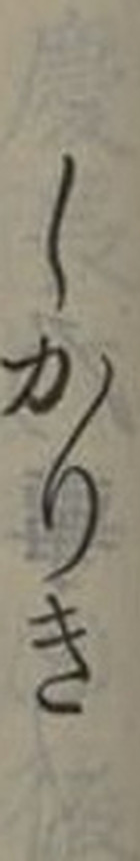しかりき
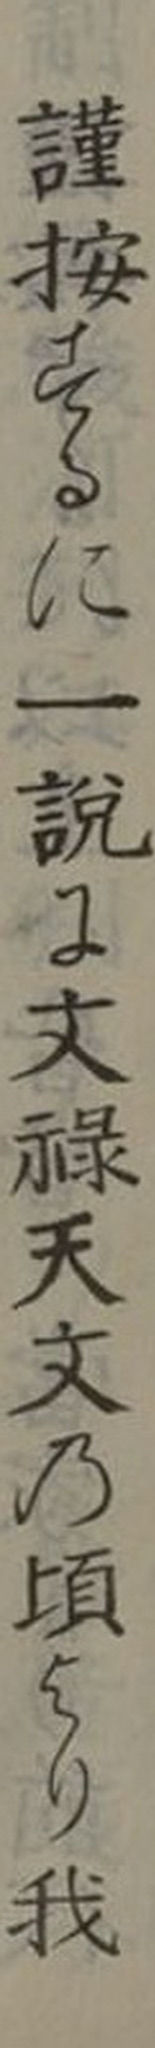謹按するに一說に文禄天文の頃より我
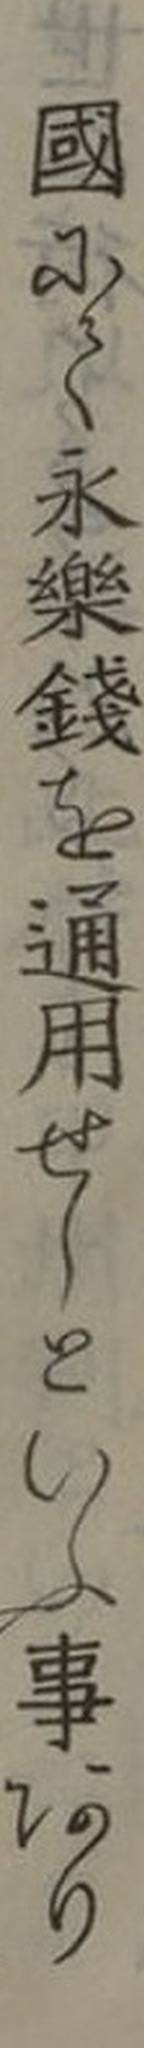國にて永樂錢を通用せしといふ事あり
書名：骨董録
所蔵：University of the Ryukyus Library
